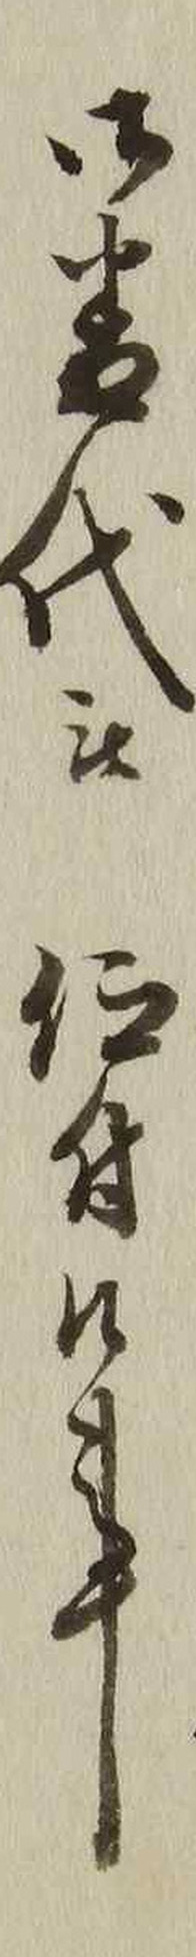御番代被仰付候事
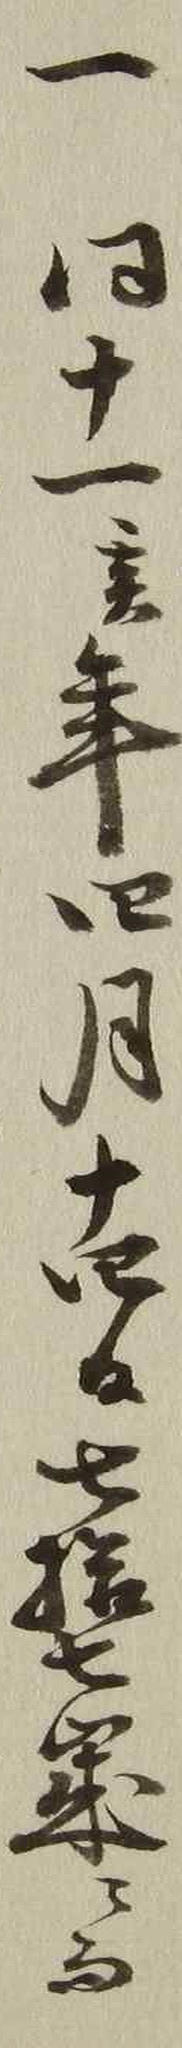一同十一亥年四月十四日七拾七歳ニ而
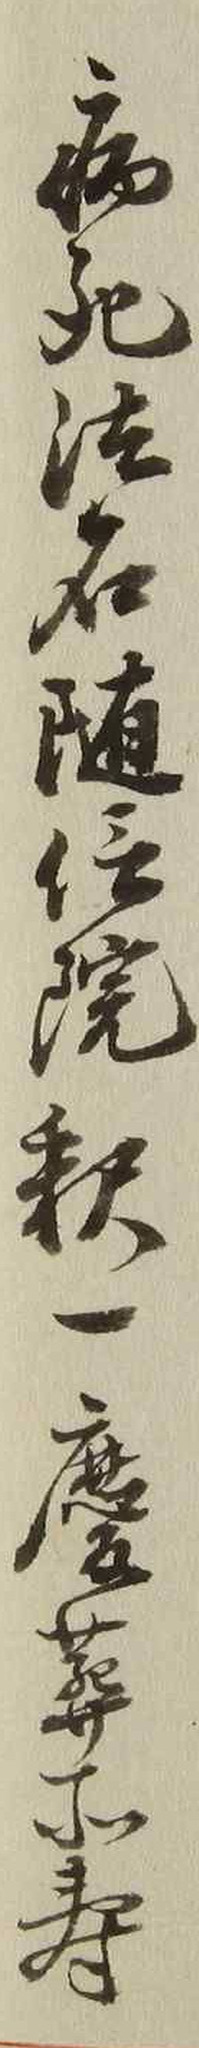病死法名随信院釈一慶葬所壽
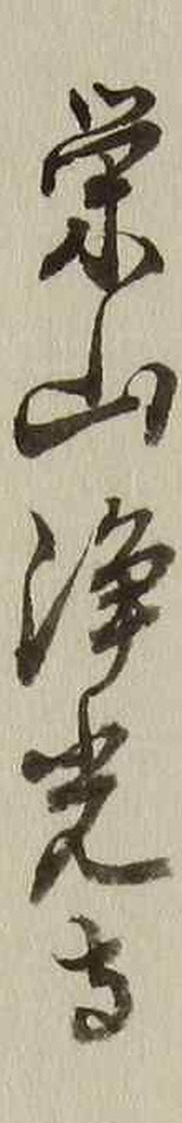栄山浄光寺
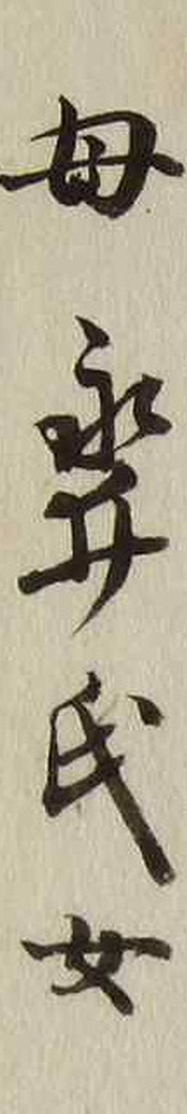母永井氏女
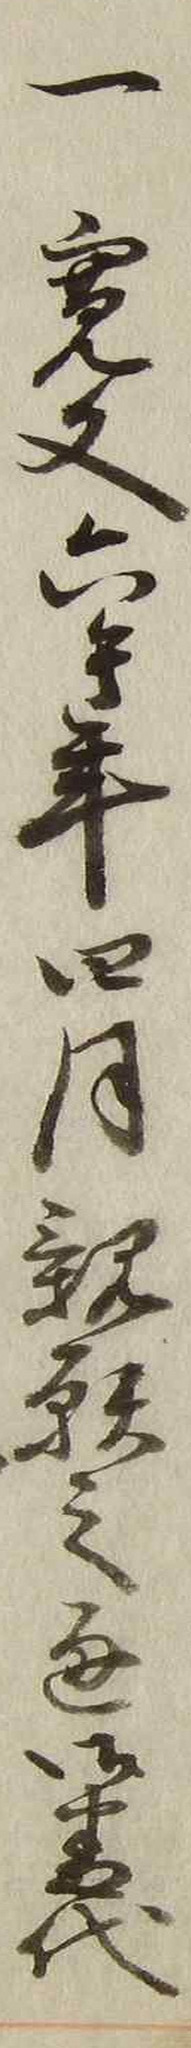一寛文六午年四月親願之通御番代
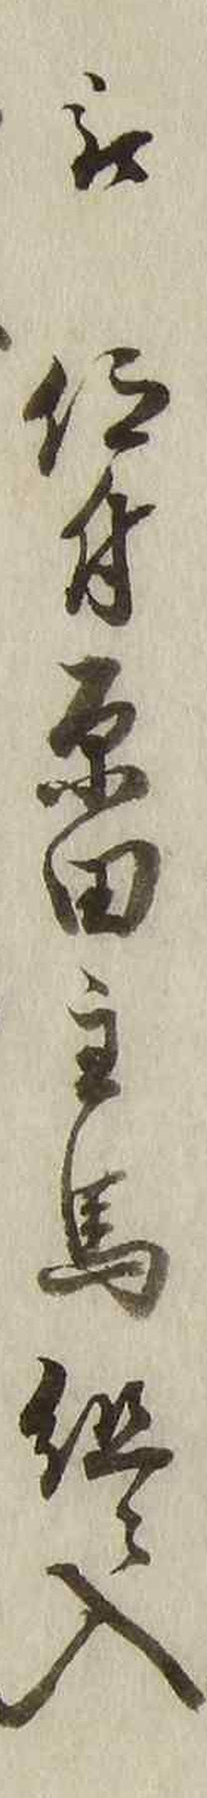被仰付原田主馬組ニ入
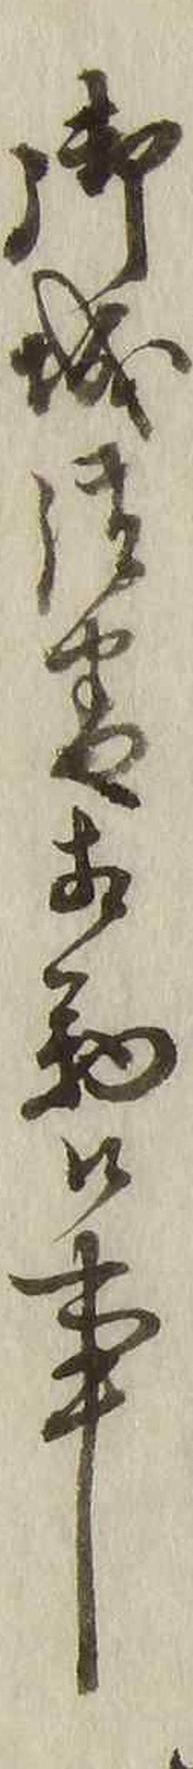御城御番相勤候事

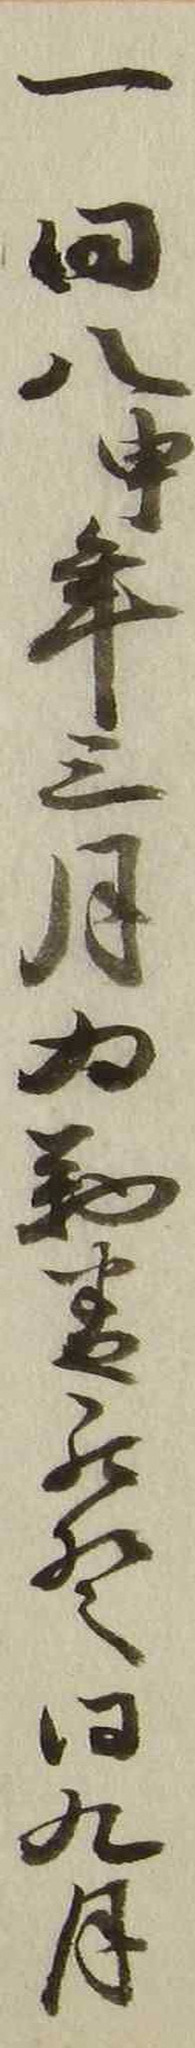一同八申年三月為勤番罷登同九月
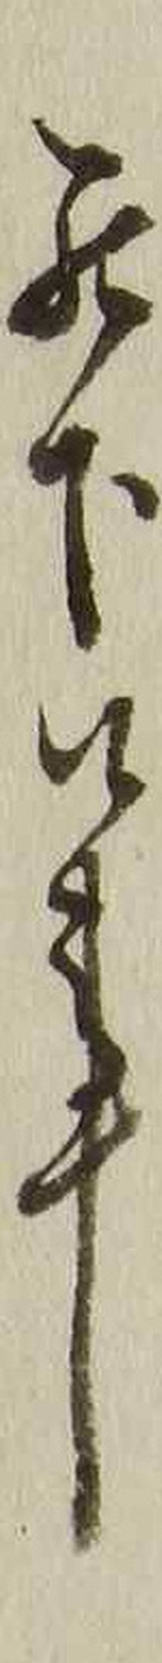罷下候事
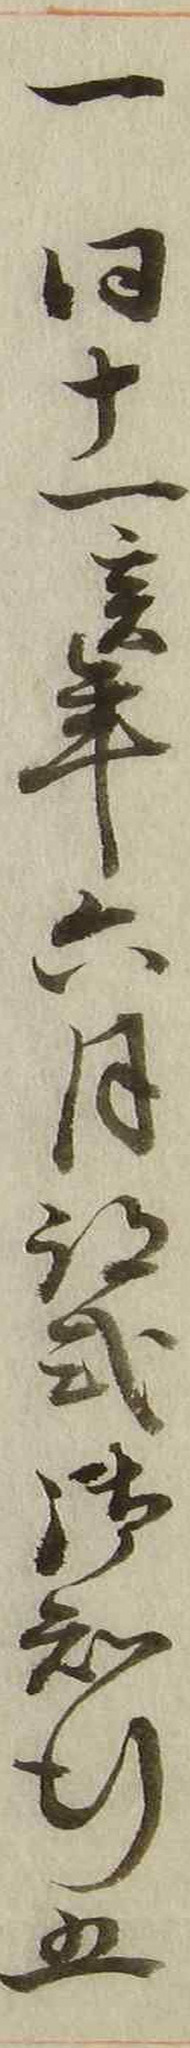一同十一亥年六月跡式御知行五
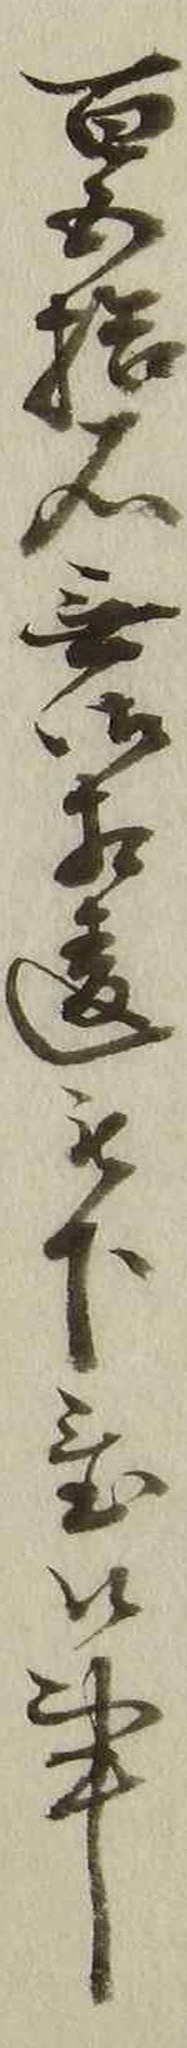百五拾石無御相違被下置候事
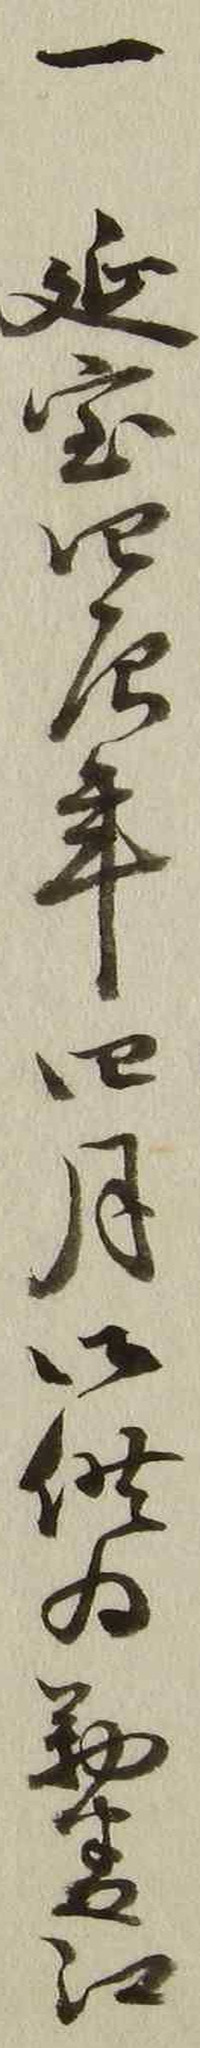一延宝四辰年四月御共為勤番江
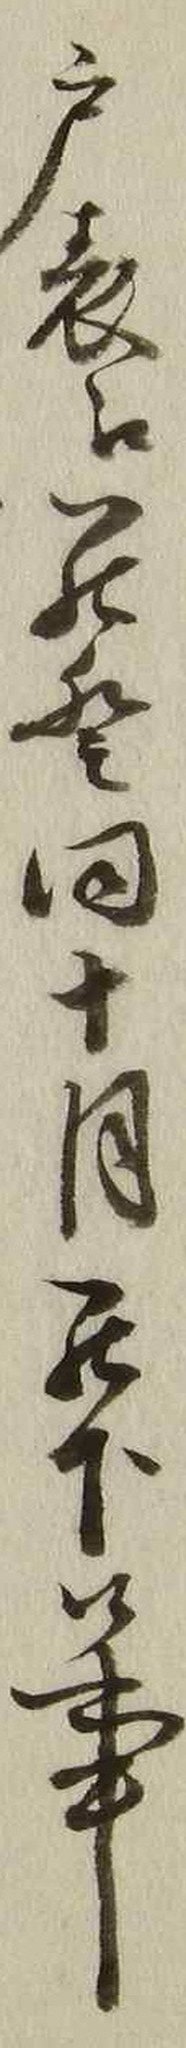戸表江罷登同十月罷下候事
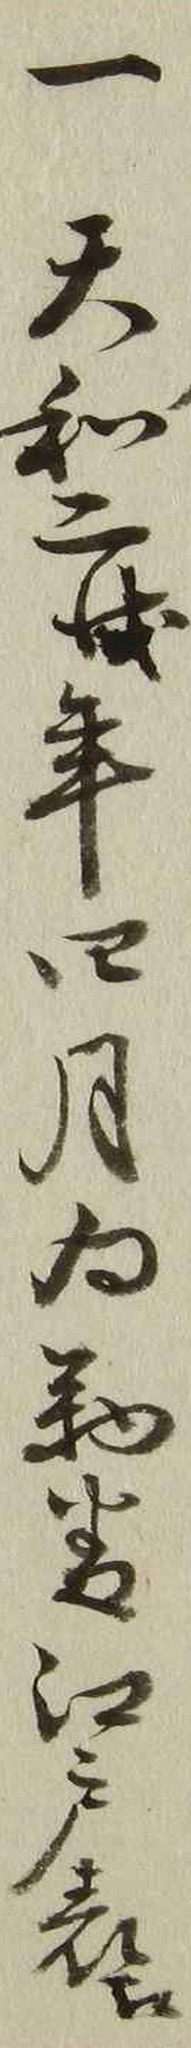一天和二戌年四月為勤番江戸表江
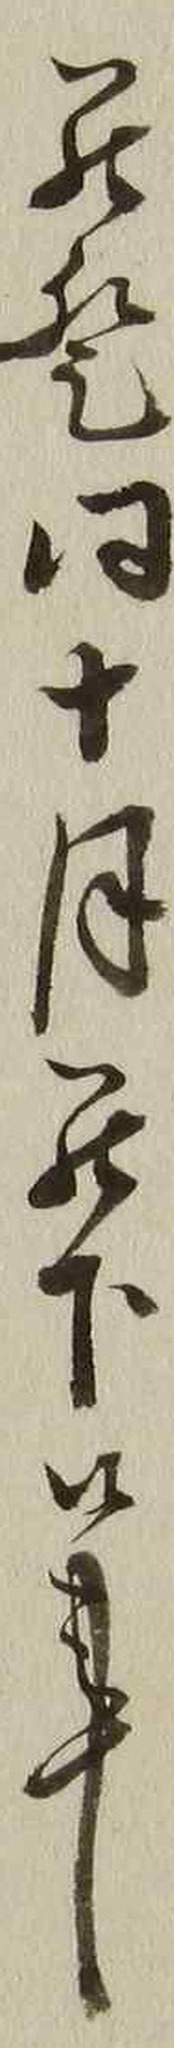罷登同十月罷下候事
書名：諸士系譜　巻之31　い之部31
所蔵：会津若松市立会津図書館
